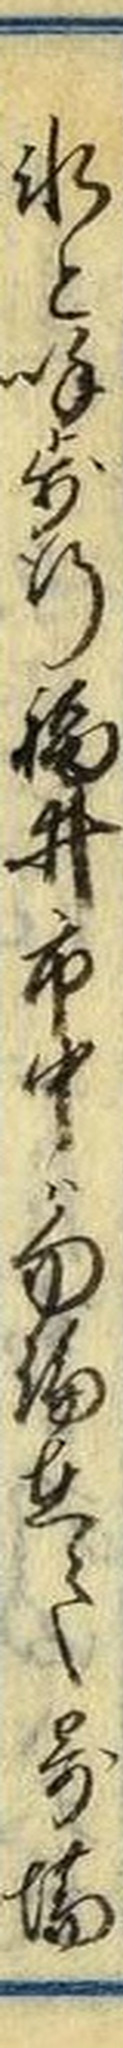氷と呼歩行福井市中は勿論在々之寄場
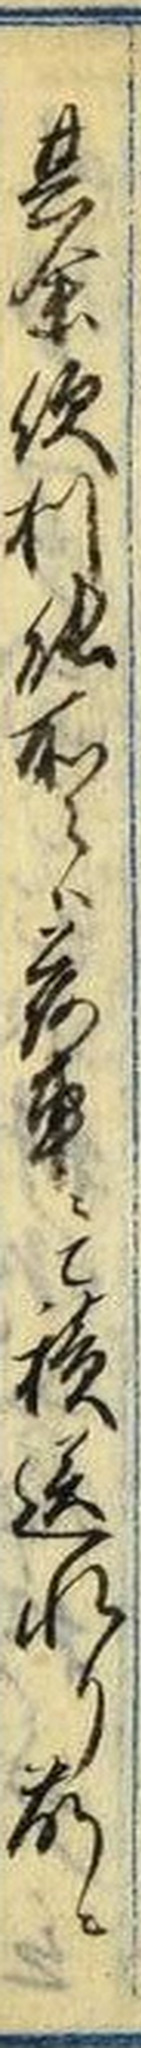其余便利能所々は荷車にて積送れり故に
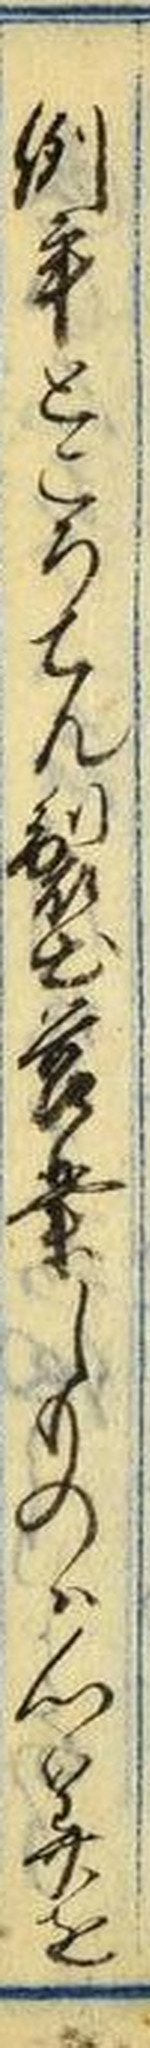例年ところてん製出営業しものは心算を

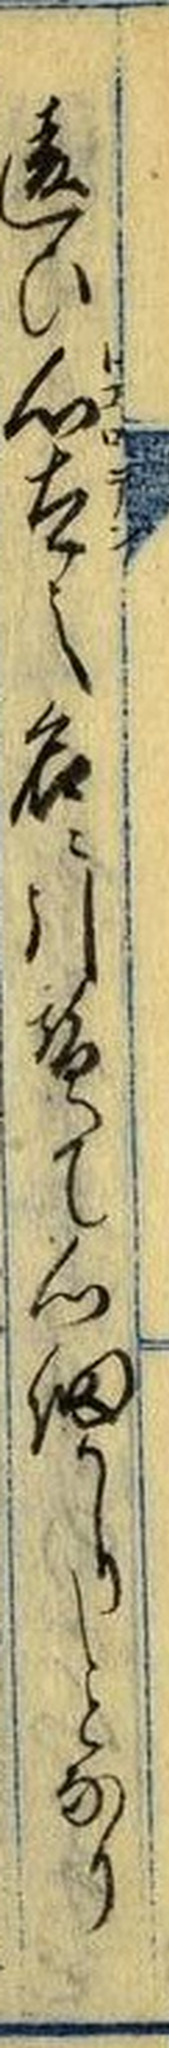違ひ心太之名に引替て心細かりしとなり
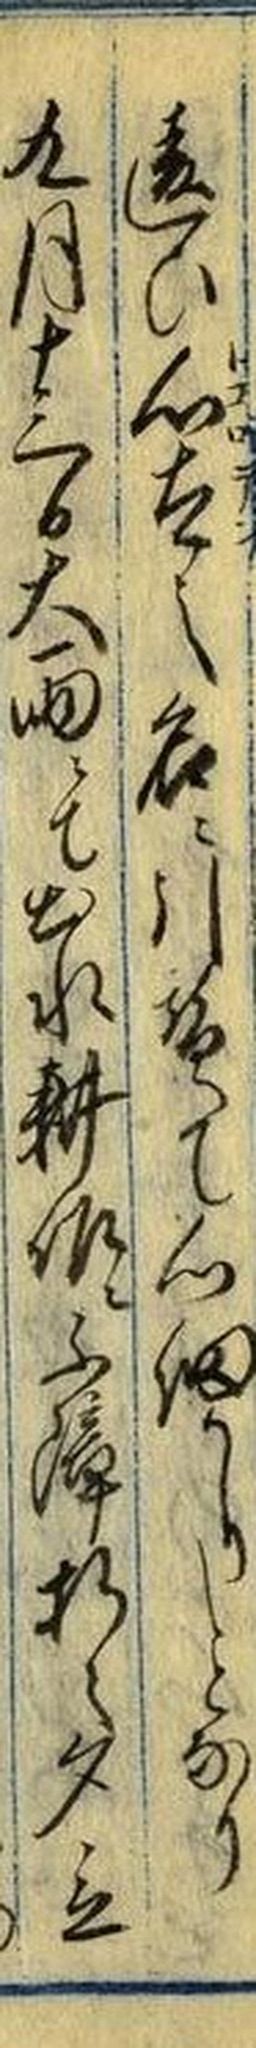九月十三日大雨にて出水耕作に不障折々夕立
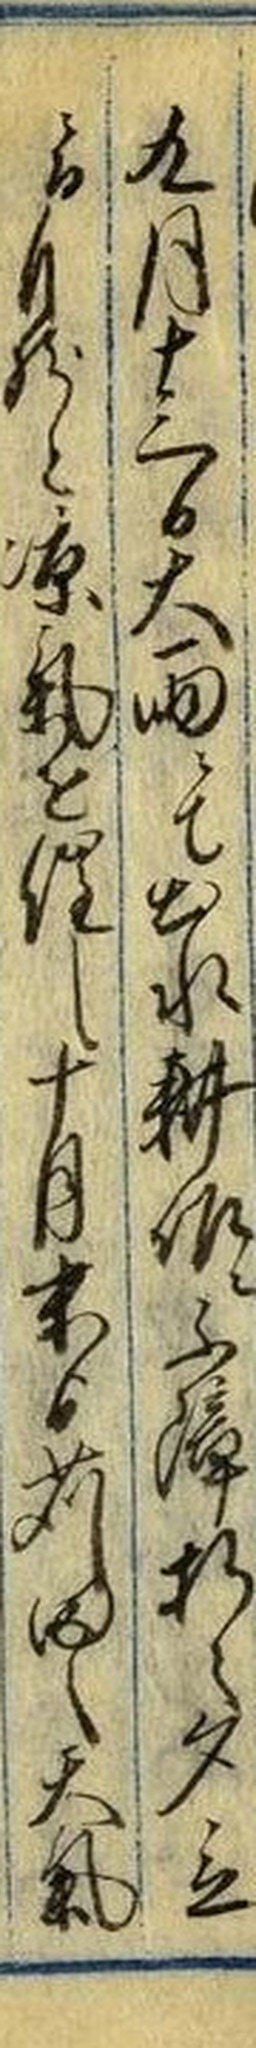に而自然と涼気を催し十月末ゟ苅田之天気
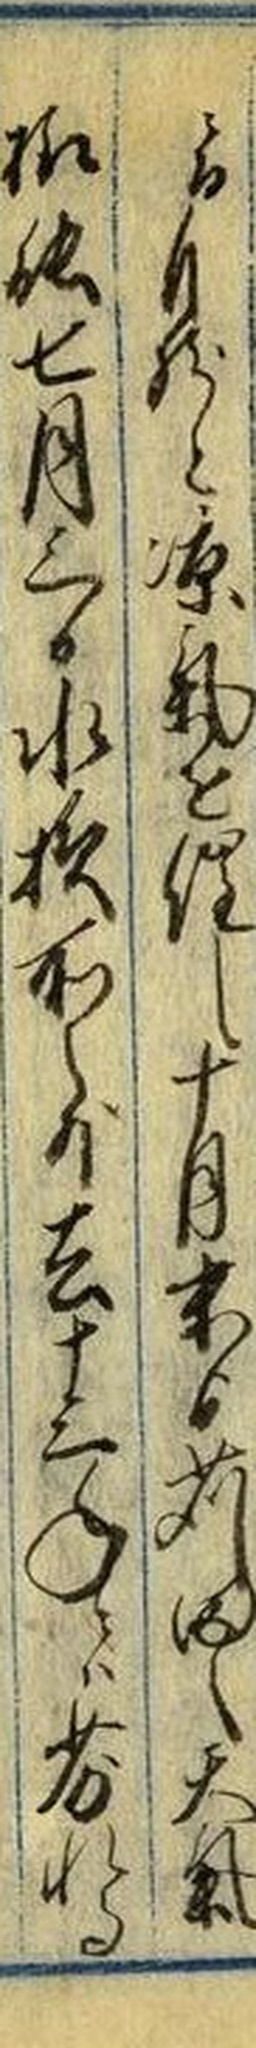様能七月三日水損所之外去十三年には劣れる
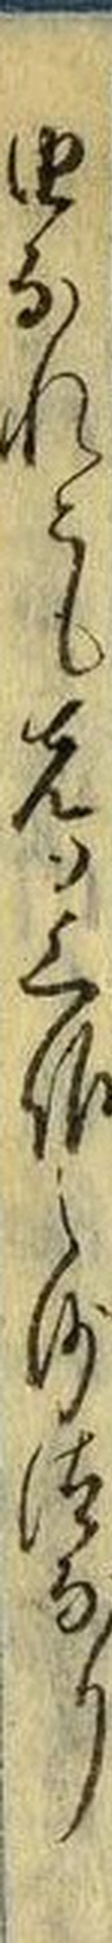由なれとも先つ上作之沙汰なり
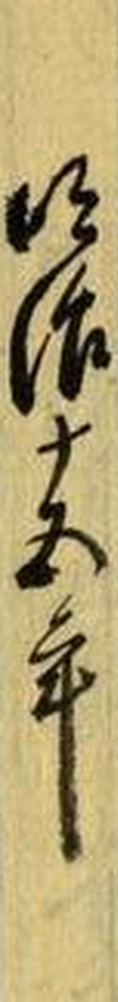明治十五年
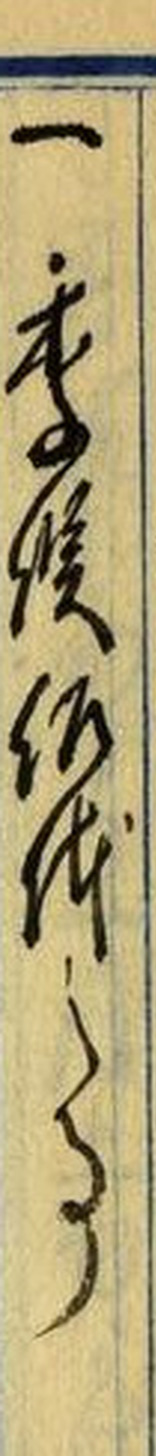一季候作体之事
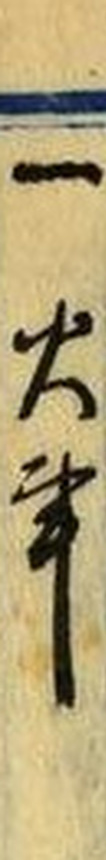一火事
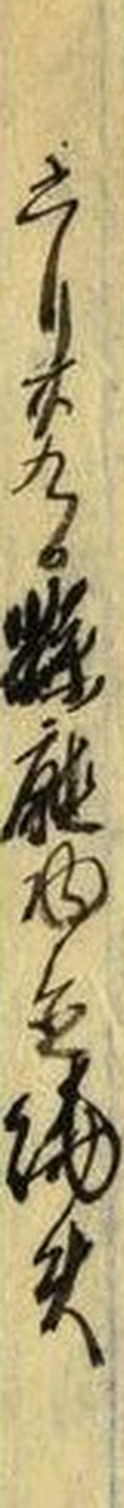六月廿九日県庁物置焼失
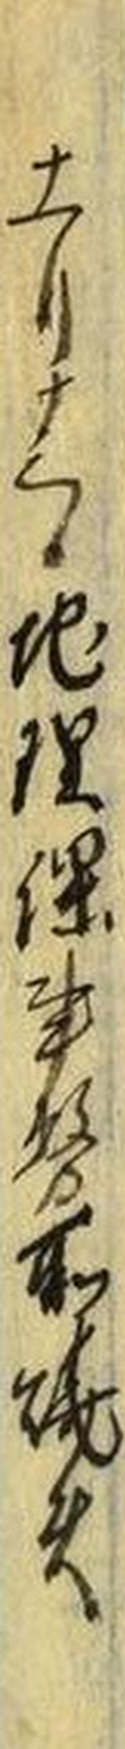十一月十三日地理課事務所焼失
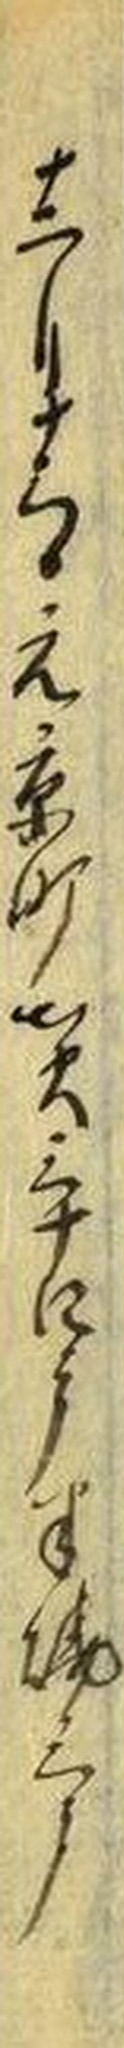十二月十三日元京町出火三十四戸半焼三戸
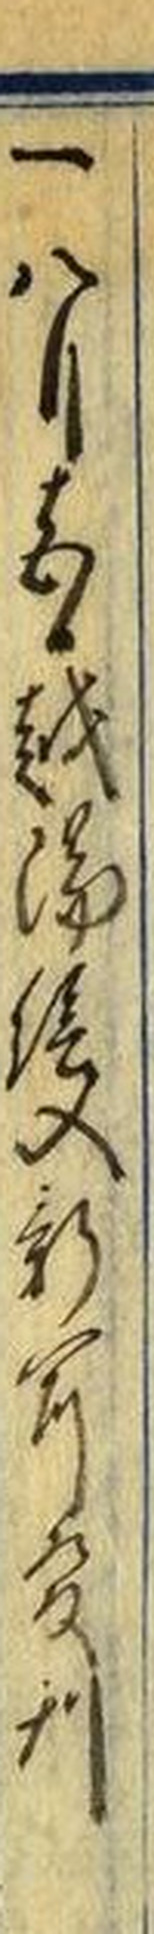一八月十五日越陽絵入新聞発刊
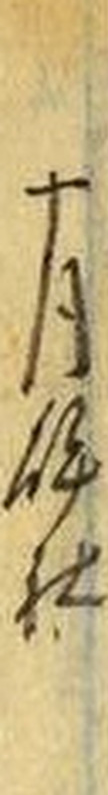十月解社
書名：温古集 五巻
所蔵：福井県文書館 Fukui Prefectural Archives
